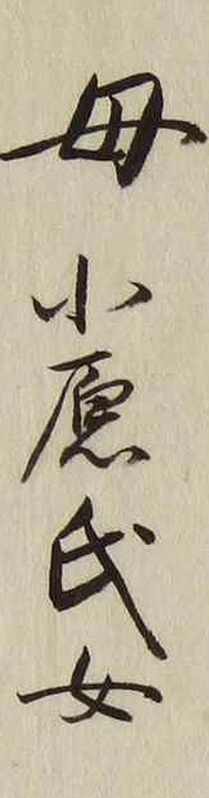母小原氏女
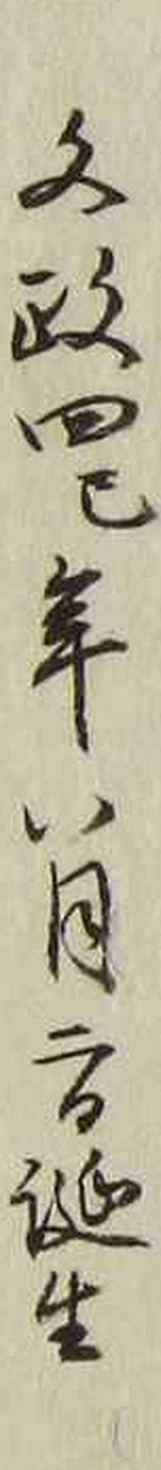女文政四巳年八月二日誕生

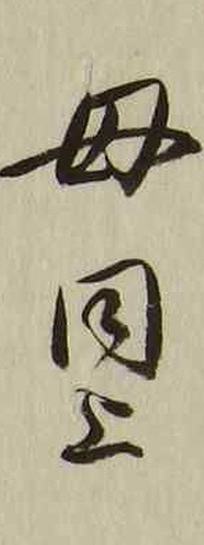母同上
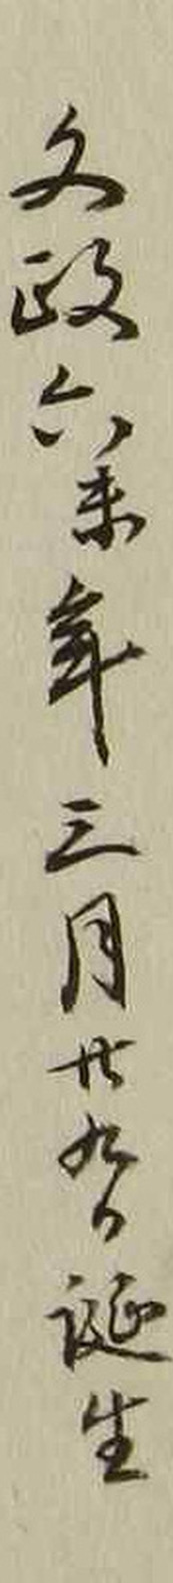泉文政六未年三月廿九日誕生
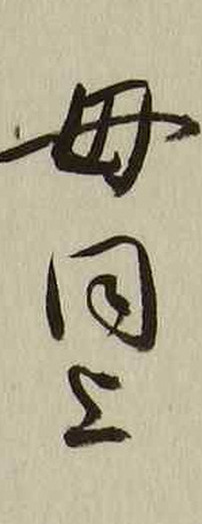母同上
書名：諸士系譜　巻之125　た之部1
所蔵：会津若松市立会津図書館
